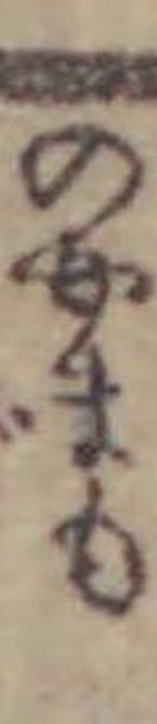のやまも
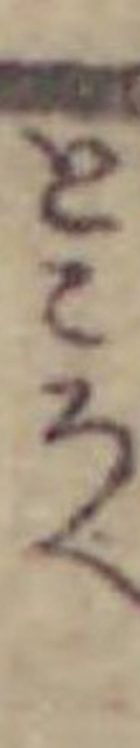ところへ
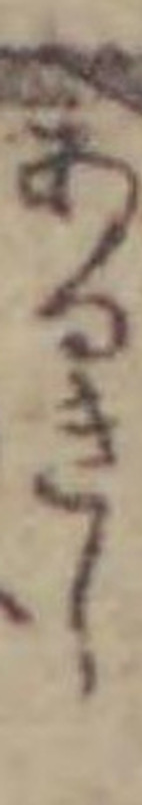あるきし
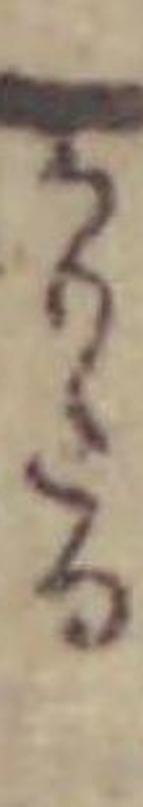かりたる
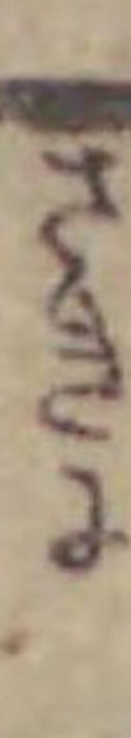さきに
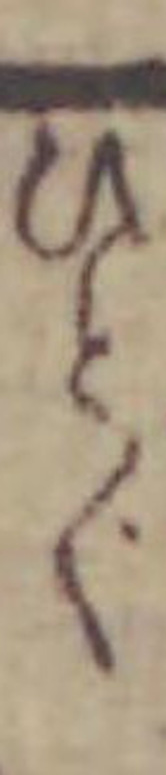ひと〴〵
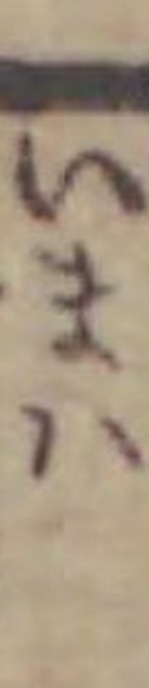いまは
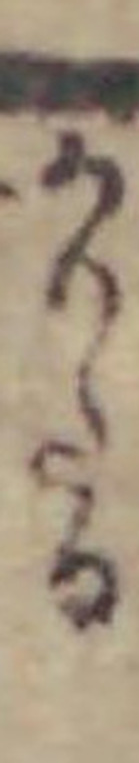かりたる
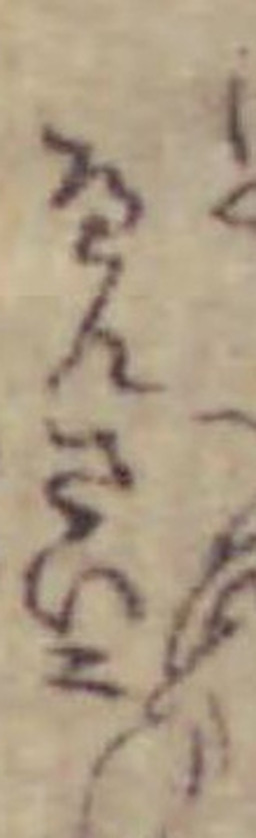へんさい
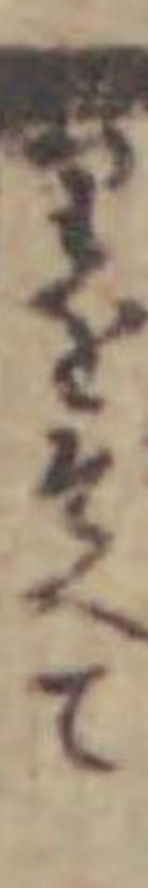りをそへて
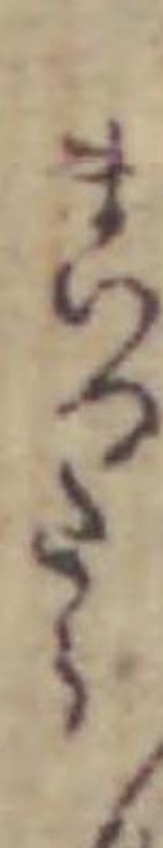まいつたら
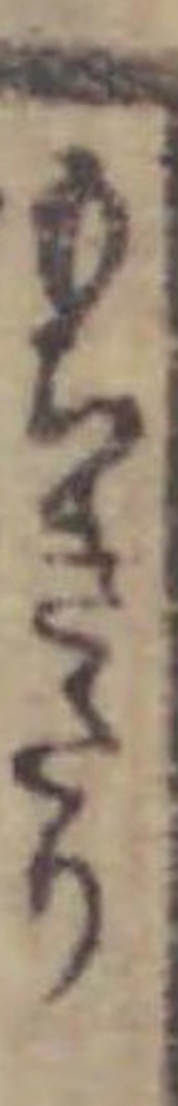おちきたり
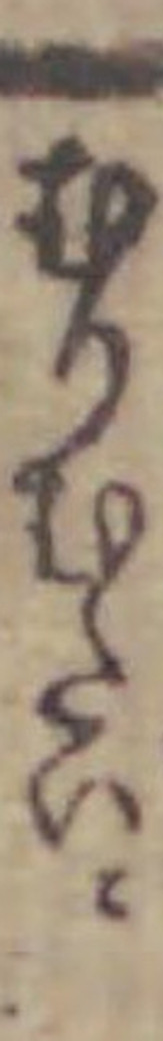むりむたいと
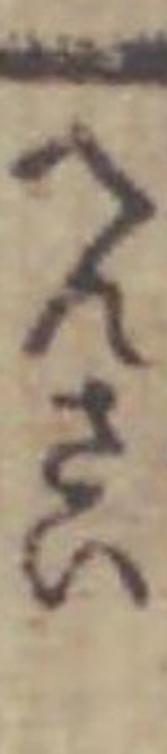へんさい
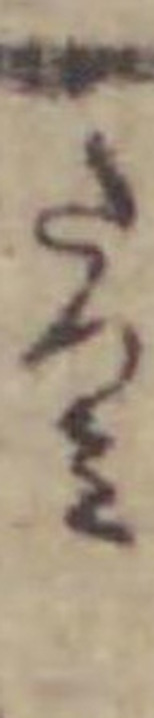たつみ

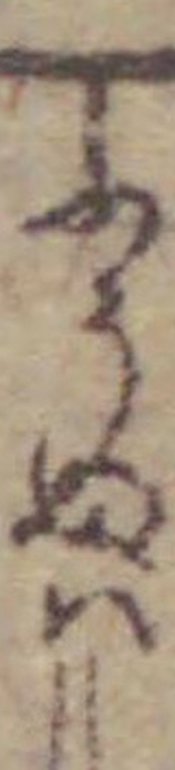ふうふは
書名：莫切自根金生木 : 3巻
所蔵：国立国会図書館 National Diet Library, JAPAN
